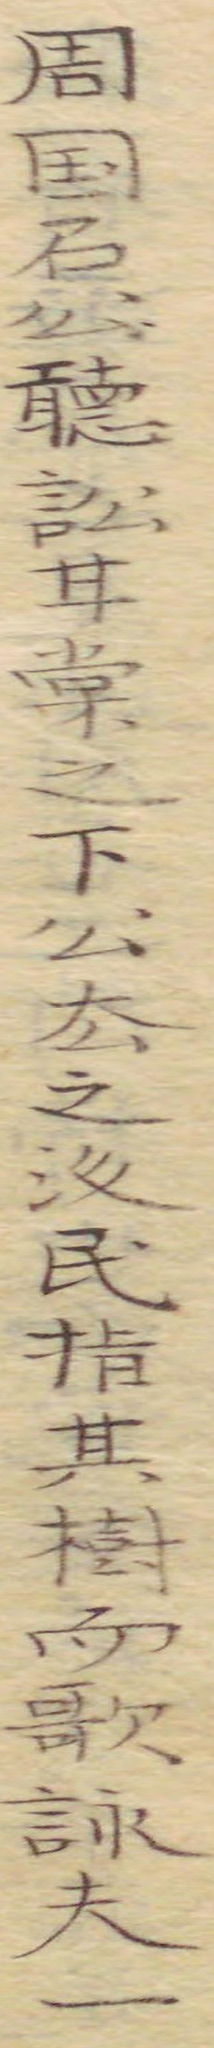周国召公聴訴甘棠之下公去之民指其樹而歌詠夫一
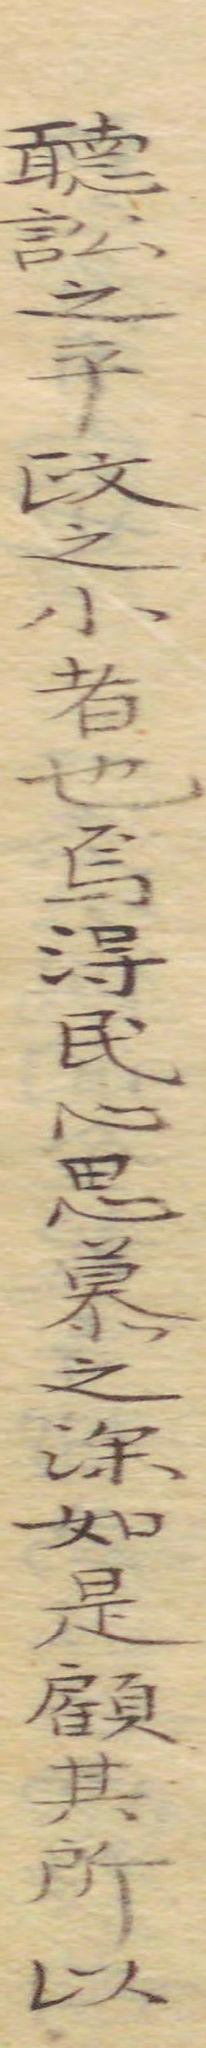聴訟之平政之小者也焉淂民心思慕之深如是顧其所以

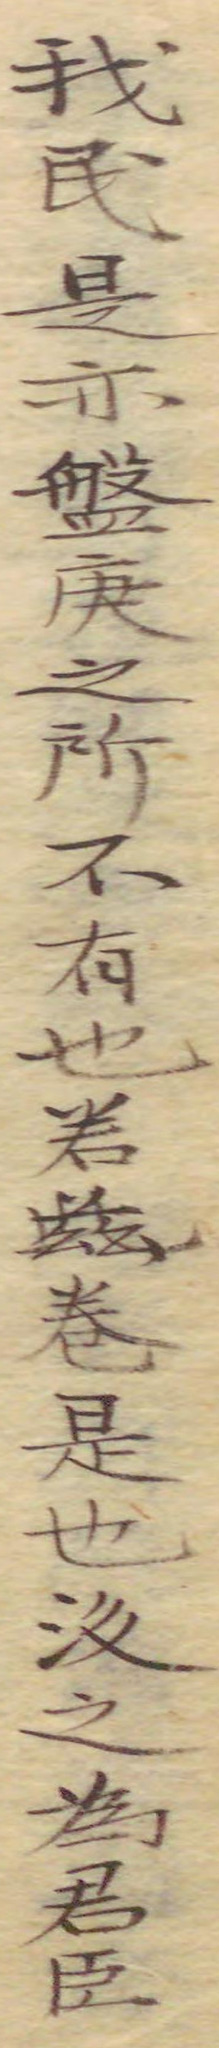我民是亦盤庚之所不有也若茲巻是也後之為君臣
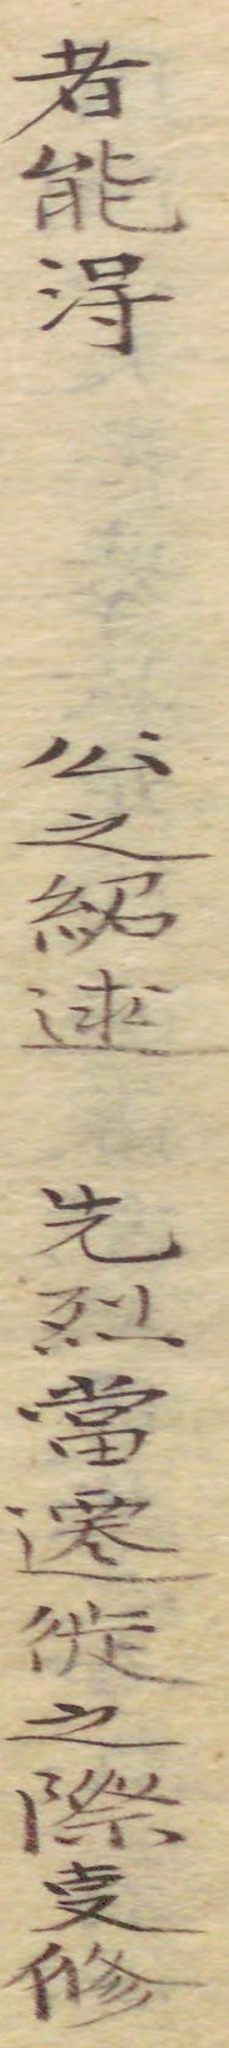者能得公之紹述先烈當遷徙之際事修
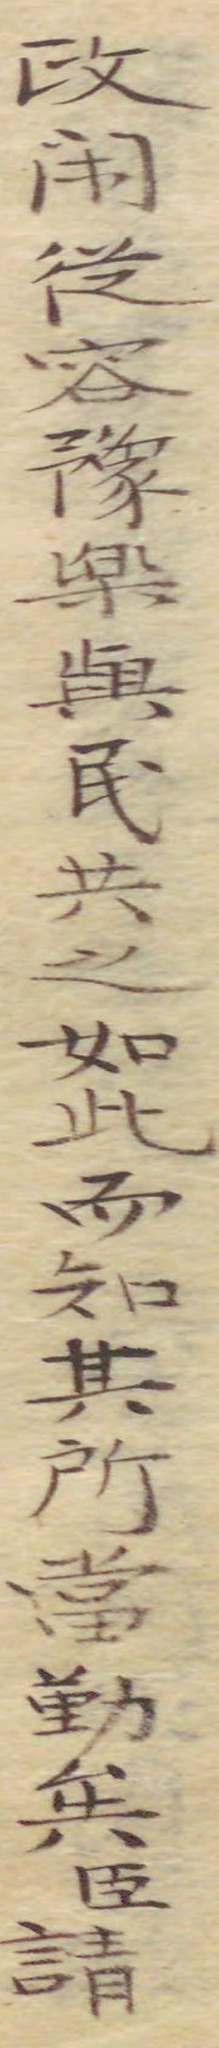政閑従容豫楽與民共之如此而知其所當勤矣臣請
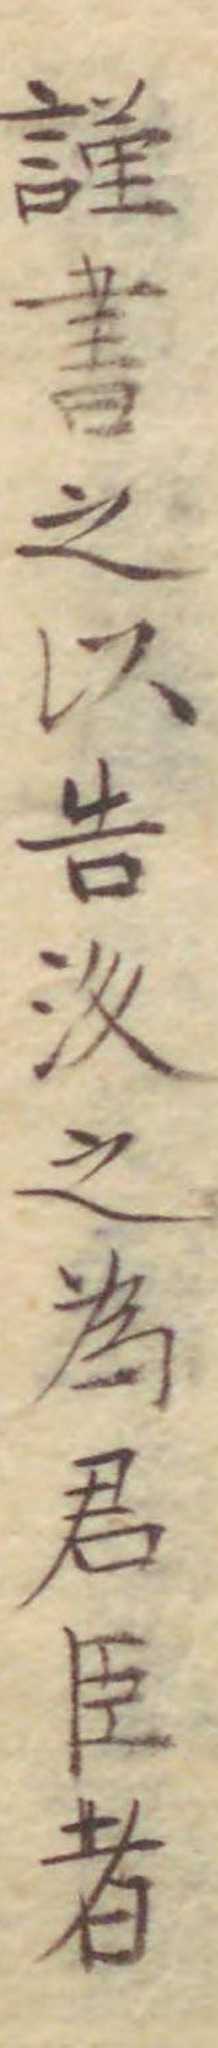謹書之以告後之為君臣者
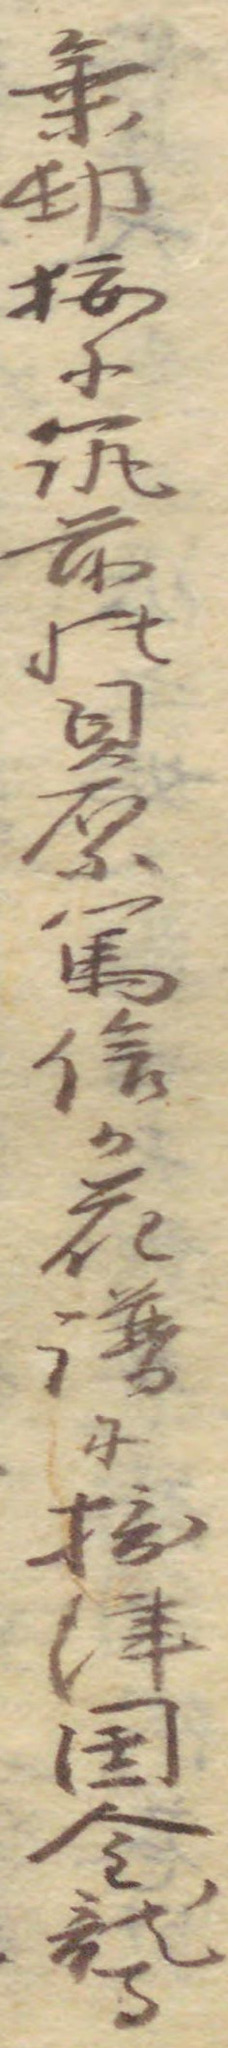乗邨按に筑前の貝原篤信か花譜に摂津国金龍寺
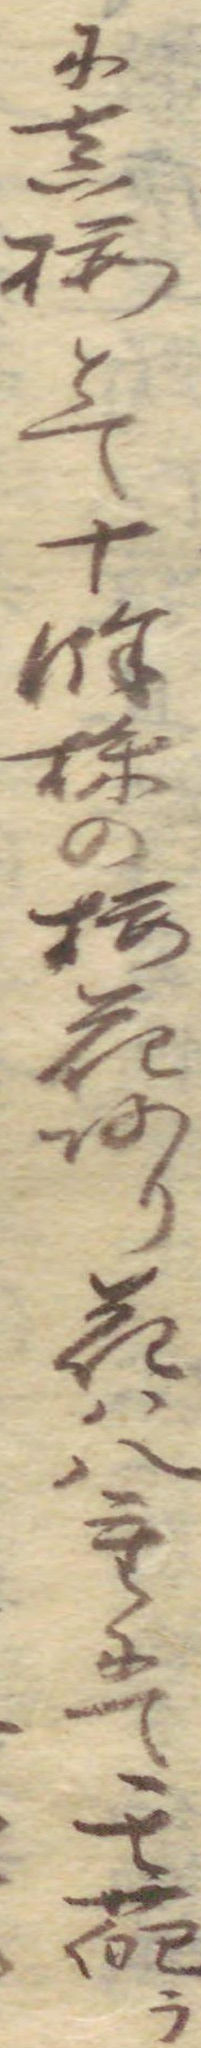に真桜とて十余株の桜花あり花は八重にて其葩ラ
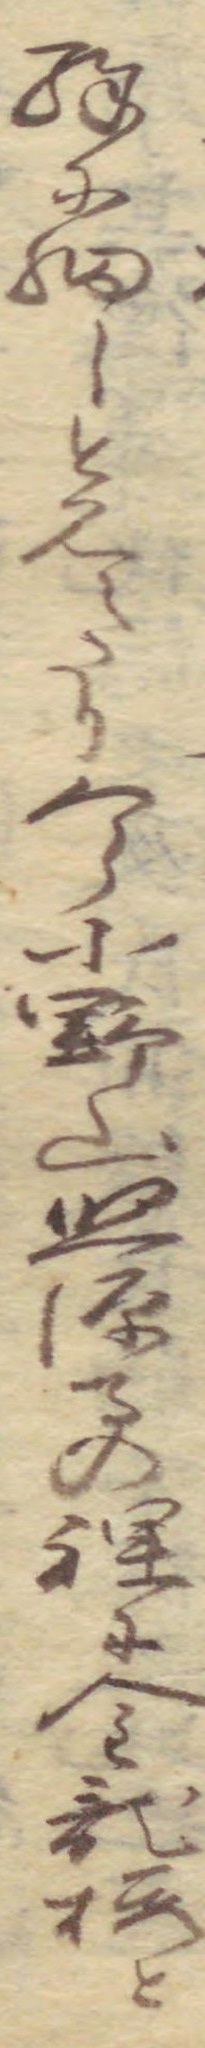殊に細しと見えたり今小野山照源寺の裡に金龍桜と
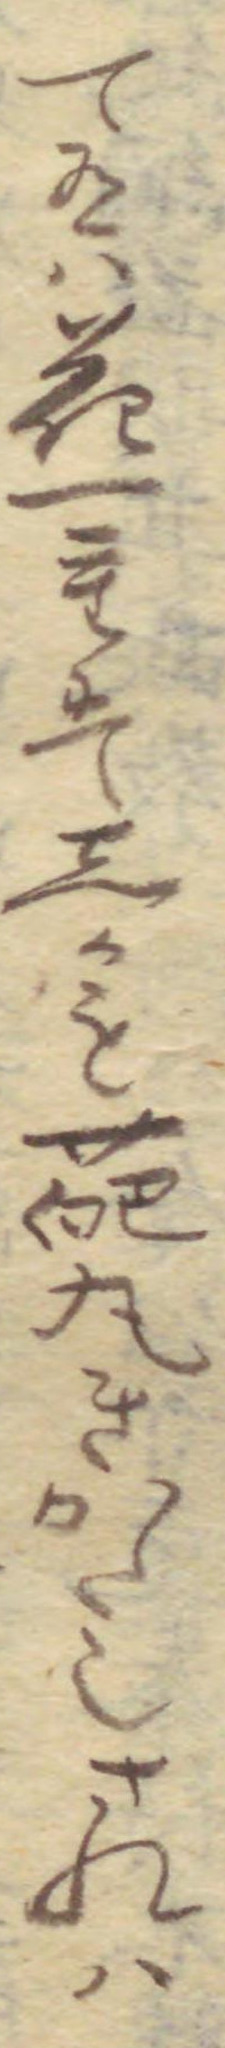て有は花一重にてしかも葩丸きかた也されは
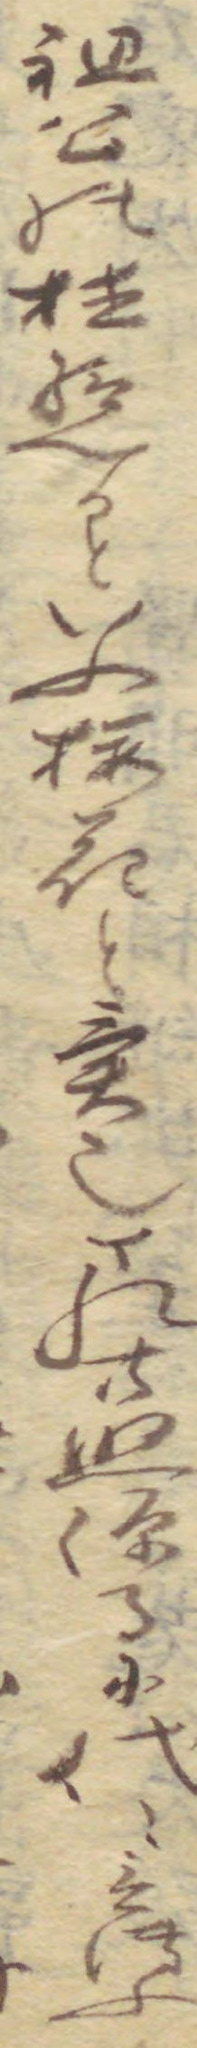祖公の植給へるといふ桜花と異也され共照源寺に代〻言伝ふ
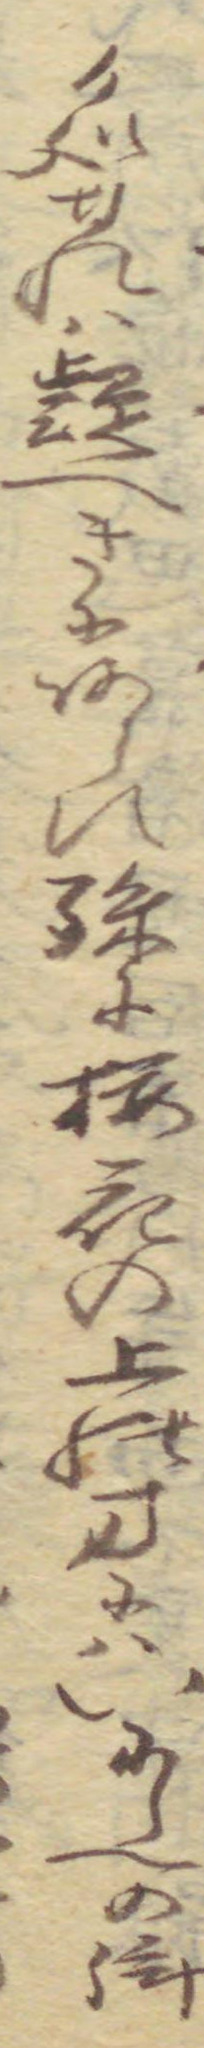る処なれは疑へきにあらす殊に桜花の上の方にはいにしへの御
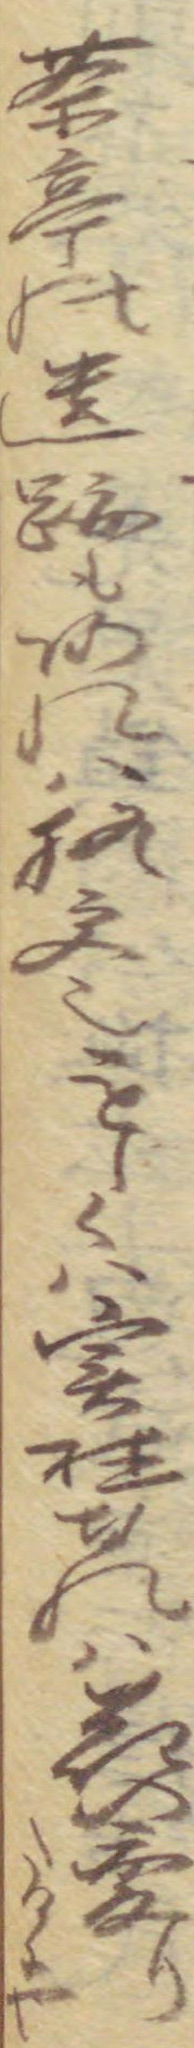茶亭の遺跡もあれは猶更也もしくは実植なれは花の変り
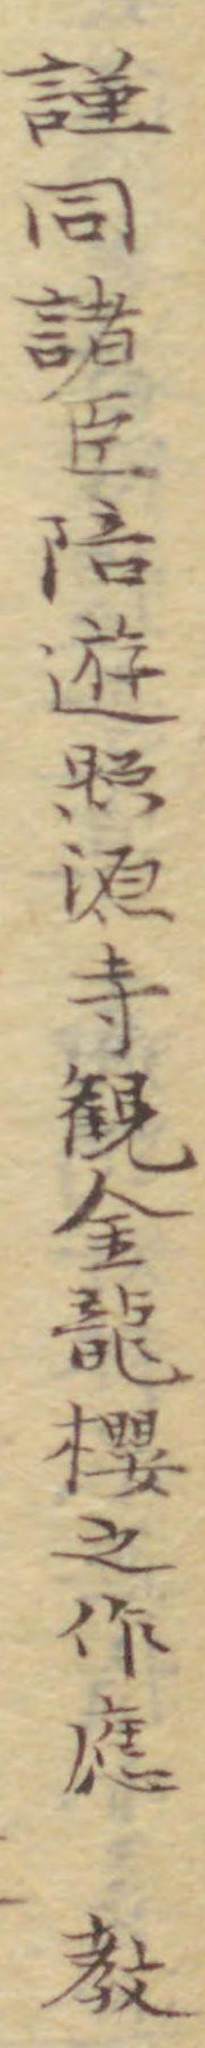謹同諸臣陪遊照源寺観金龍桜之作應教
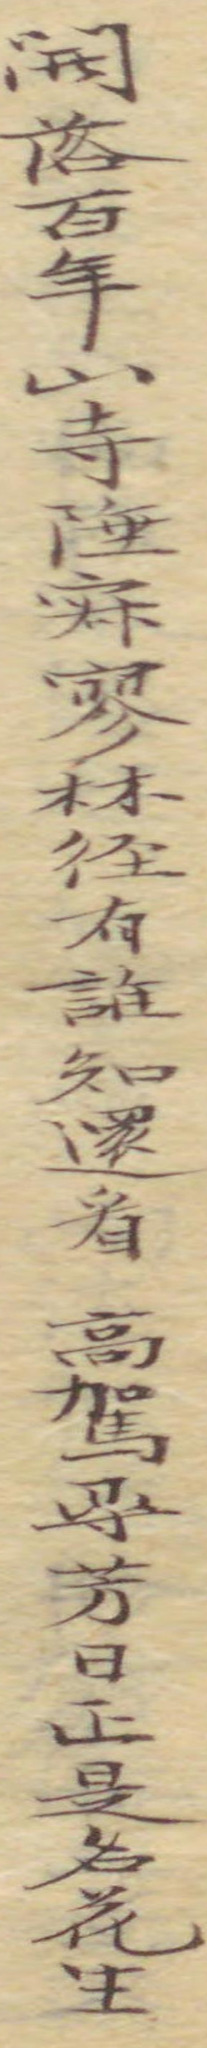開落百年山寺陲寂寥林径有誰知還看高駕尋芳日正是名花生
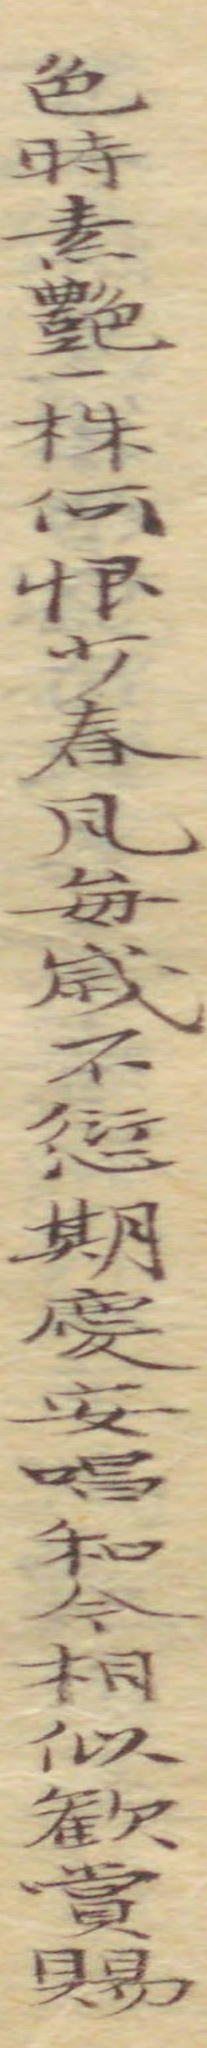色時素艶一株何恨少春風毎歳不愆期慶安唱和今相似観賞賜
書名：鶯宿雑記. 巻263-264
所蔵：国立国会図書館 National Diet Library, JAPAN
